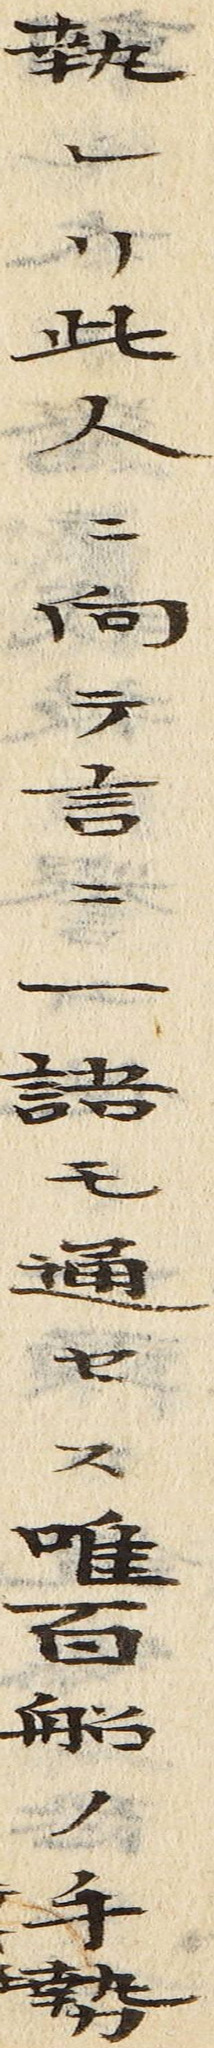執レリ此人ニ向テ言ニ一語モ通セス唯百船ノ手勢
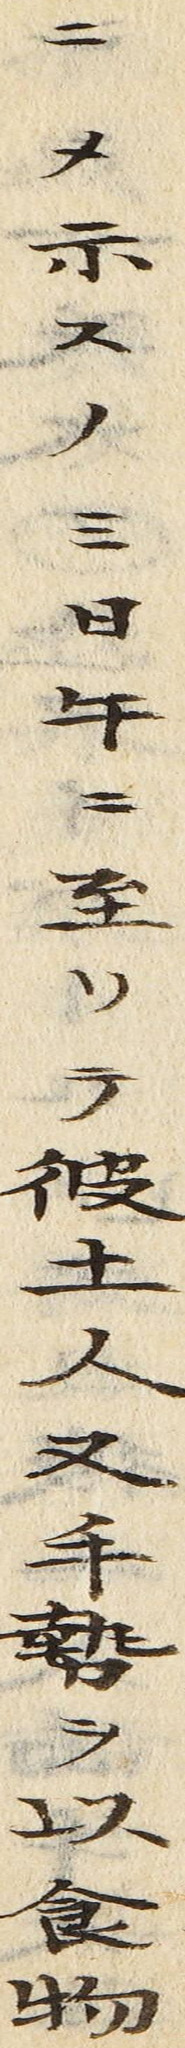ニシテ示スノミ日午ニ至リテ彼土人又手勢ヲ以食物
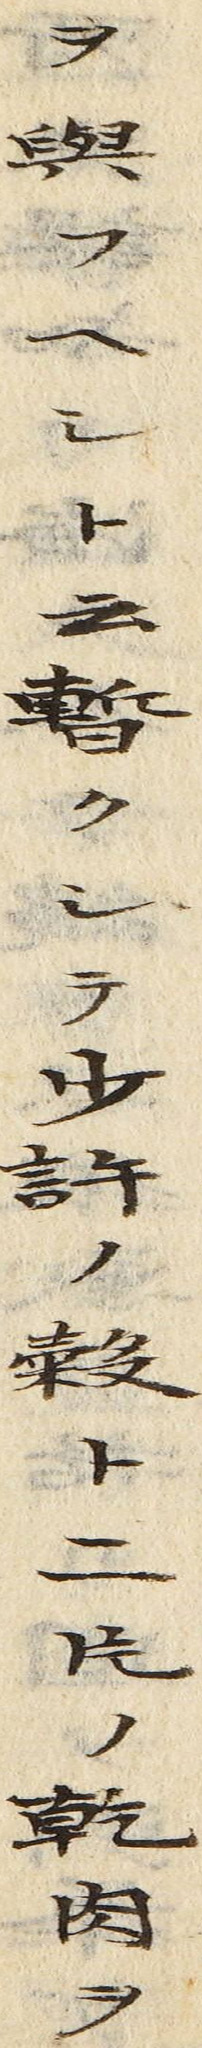ヲ与フヘシト云暫クシテ少許ノ穀ト二片ノ乾肉ヲ
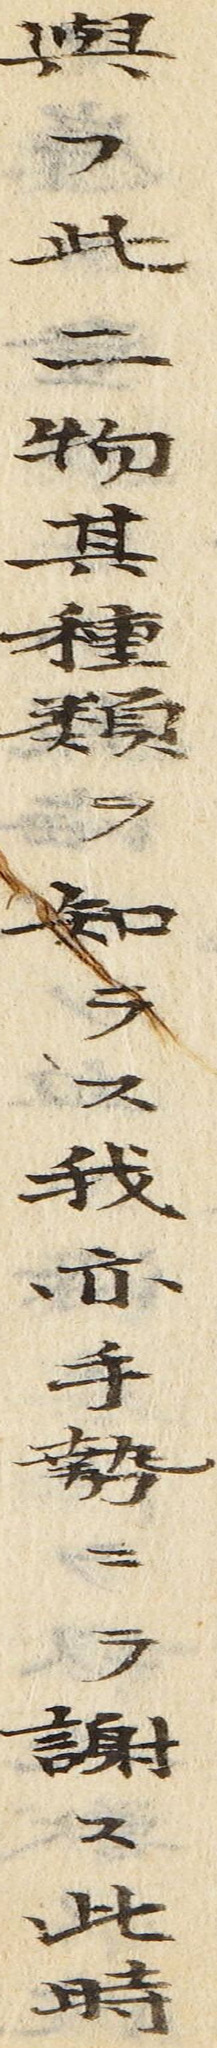与フ此二物其種類ヲ知ラス我亦手勢ニラ謝ス此時
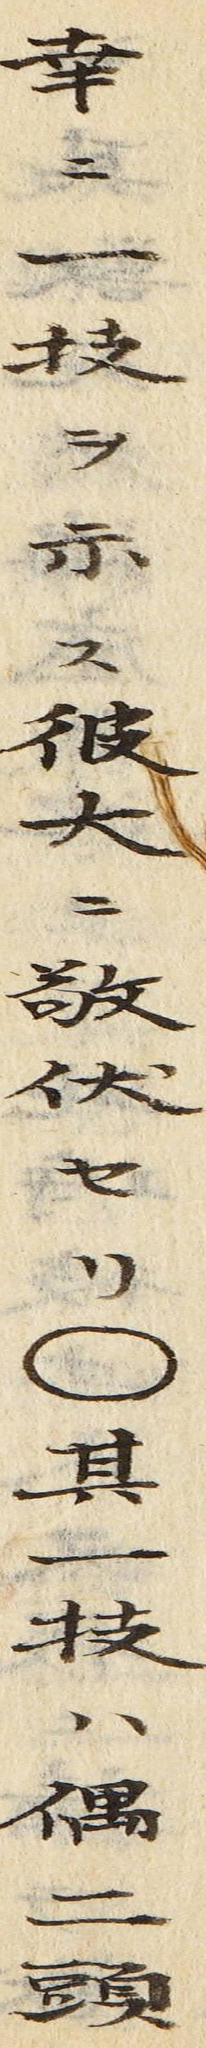幸ニ一枝ヲ示ス彼大ニ敬伏セリ◯其一枝ハ偶二頭
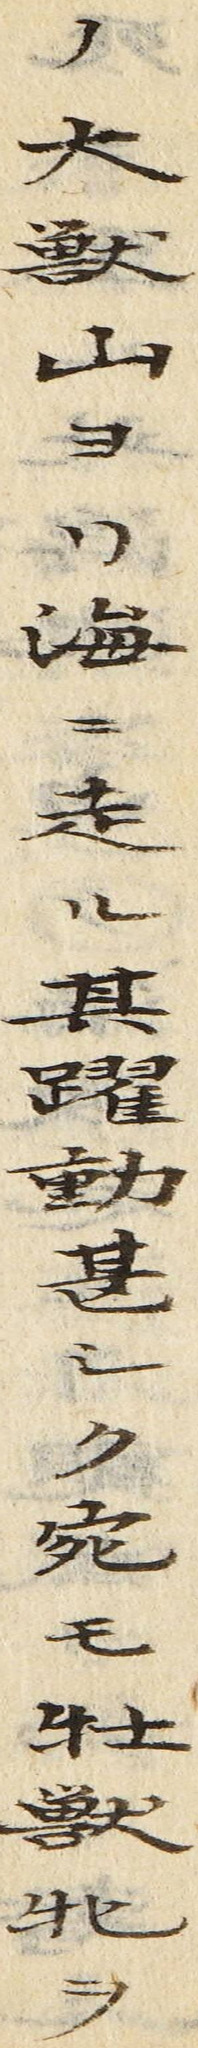ノ大獣山ヨリ海ニ走ル其躍動甚シク宛モ牡獣牝ヲ
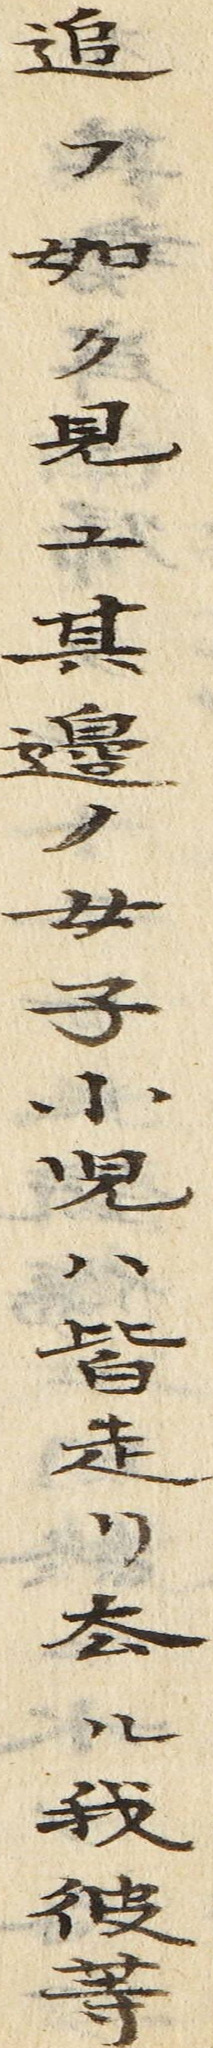追フ如ク見ユ其辺ノ女子小児ハ皆走リ去ル我彼等
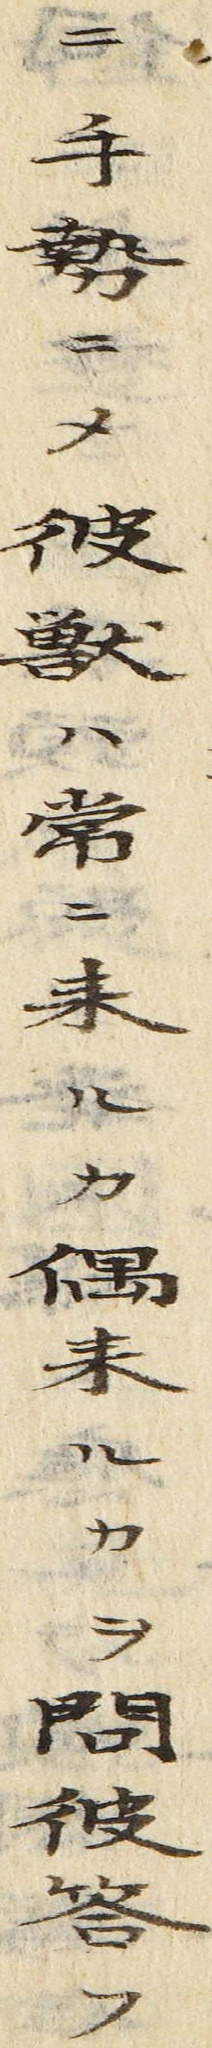ニ手勢ニシテ彼獣ハ常ニ来ルカ偶来ルカヲ問彼答フ
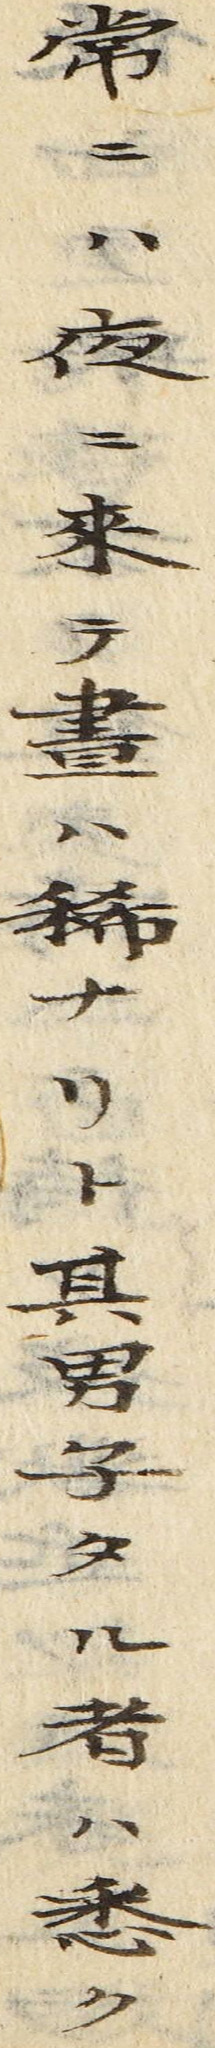常ニハ夜ニ来テ昼ハ稀ナリト其男子タル者ハ悉ク
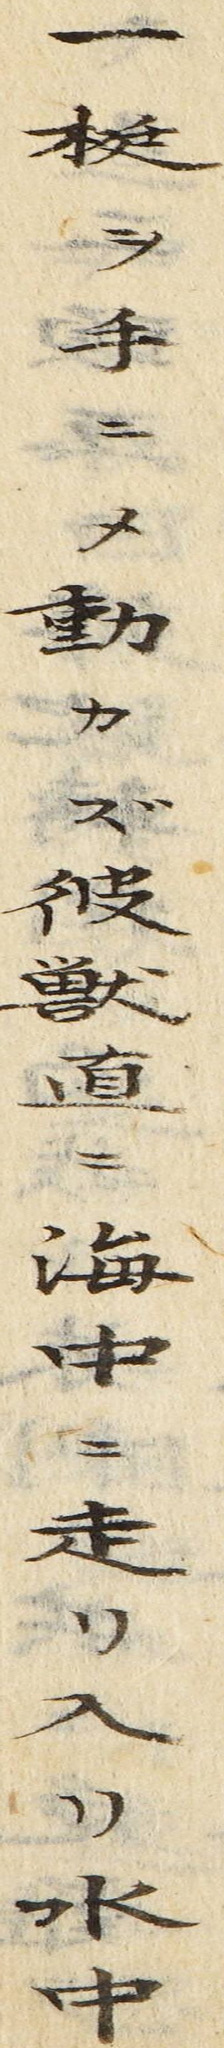一梃ヲ手ニシテ動カズ彼獣直ニ海中ニ走リ入リ水中

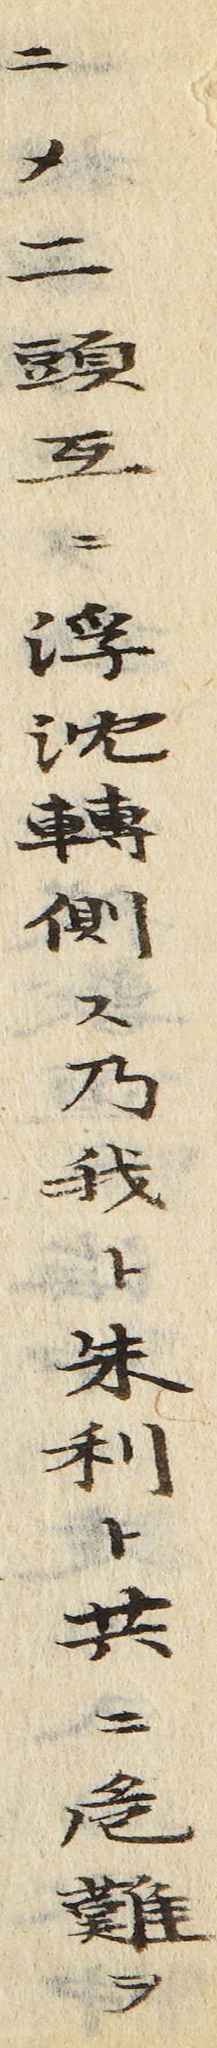ニシテ二頭互ニ浮沈転側ス乃我ト朱利ト共ニ危難ヲ
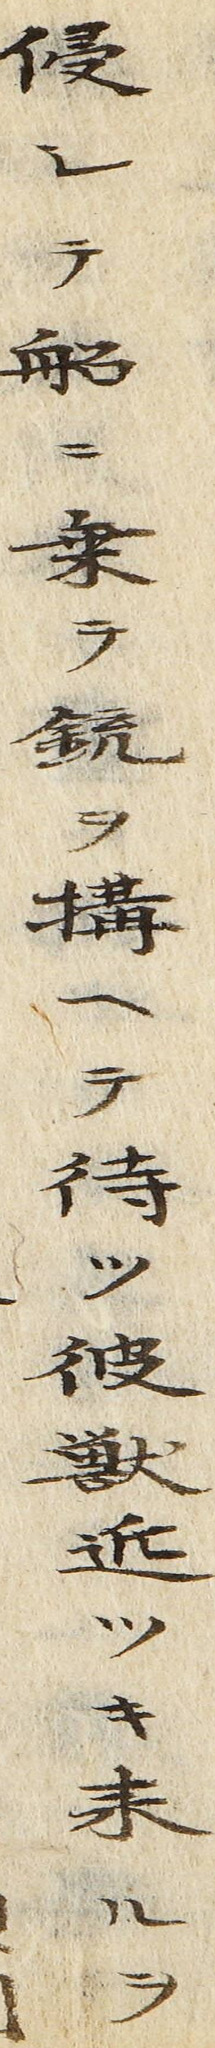侵シテ船ニ乗テ銃ヲ搆ヘテ待ツ彼獣近ツキ来ルヲ
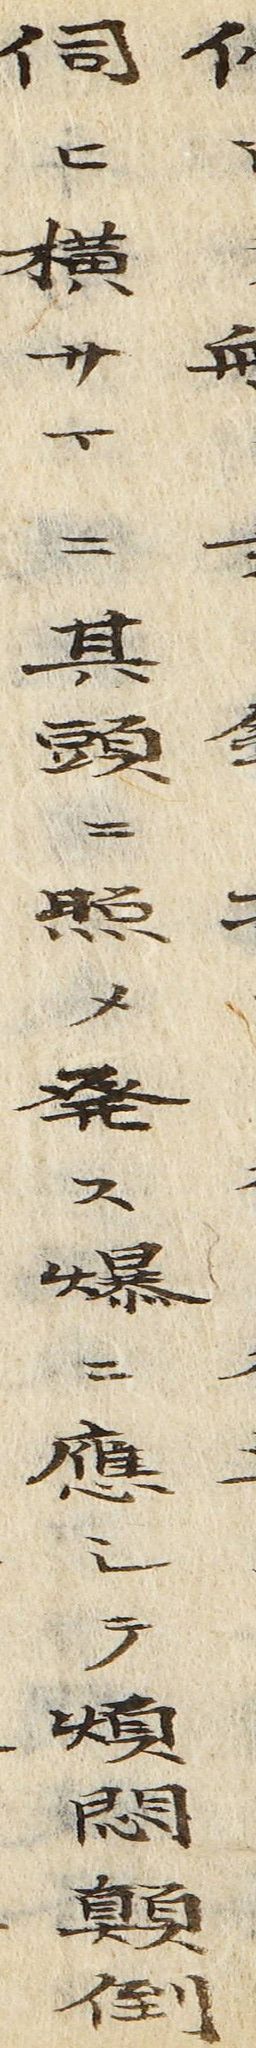伺ヒ横サマニ其頭ニ照シテ発ス爆ニ応シテ煩悶顚倒
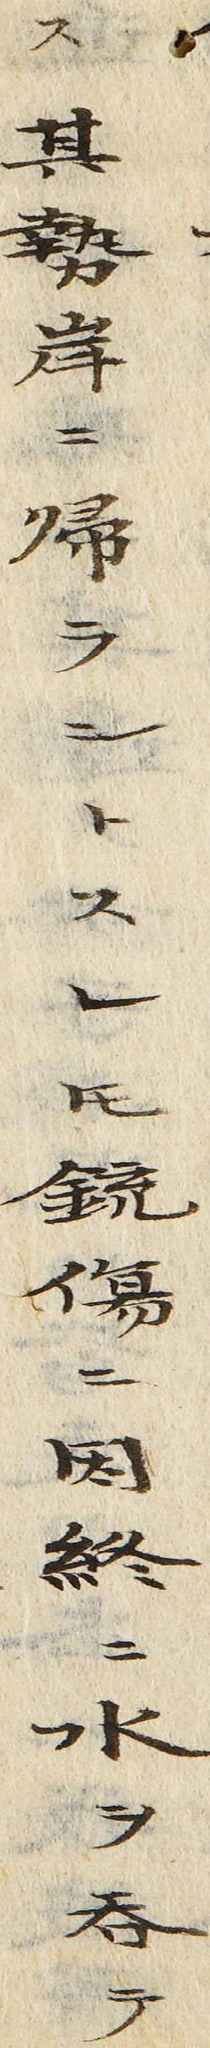ス其勢岸ニ帰ラントスレトモ銃傷ニ因終ニ水ヲ呑テ
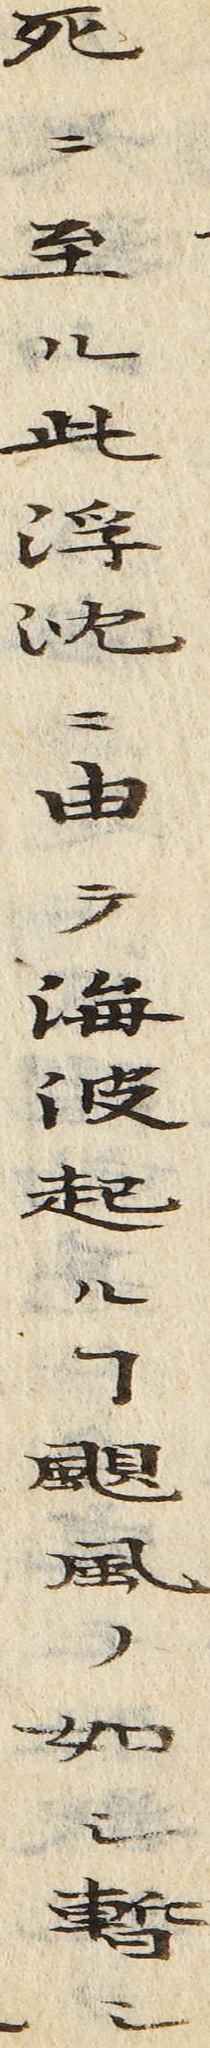死ニ至ル此浮沈ニ由テ海波起ルコト颶風ノ如シ暫シ
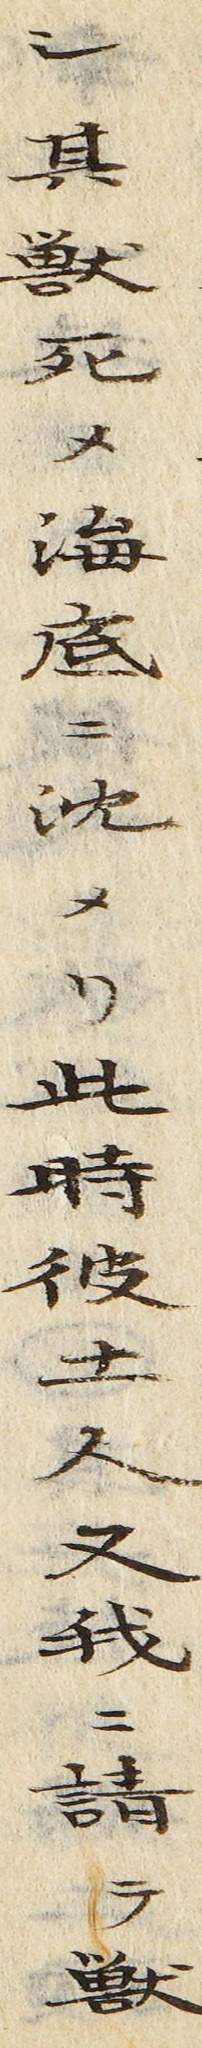シ其獣死シテ海底ニ沈メリ此時彼土人又我ニ請テ獣
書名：漂流紀事
